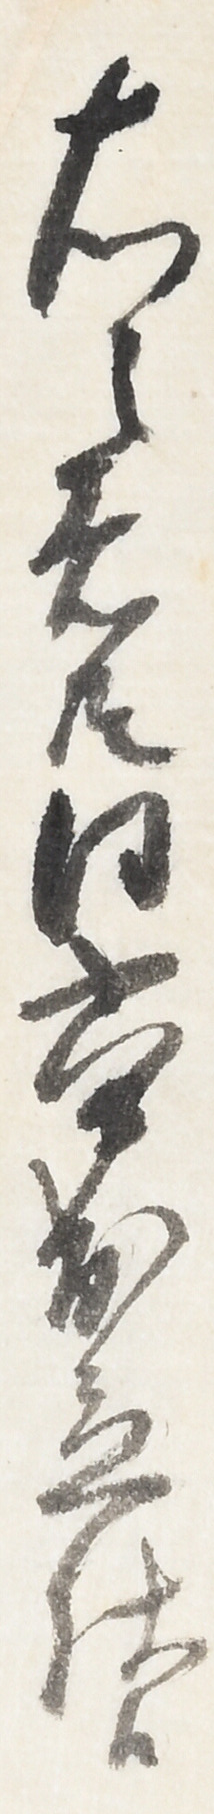右之者共同六日出立仕候
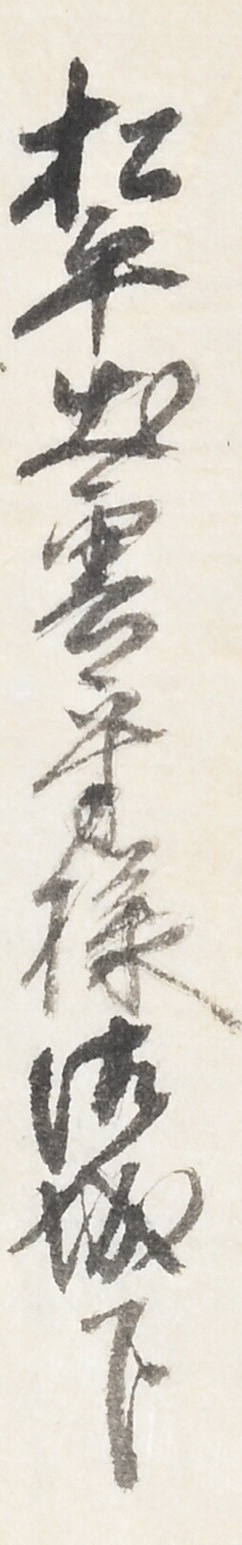松平出雲守様御城下
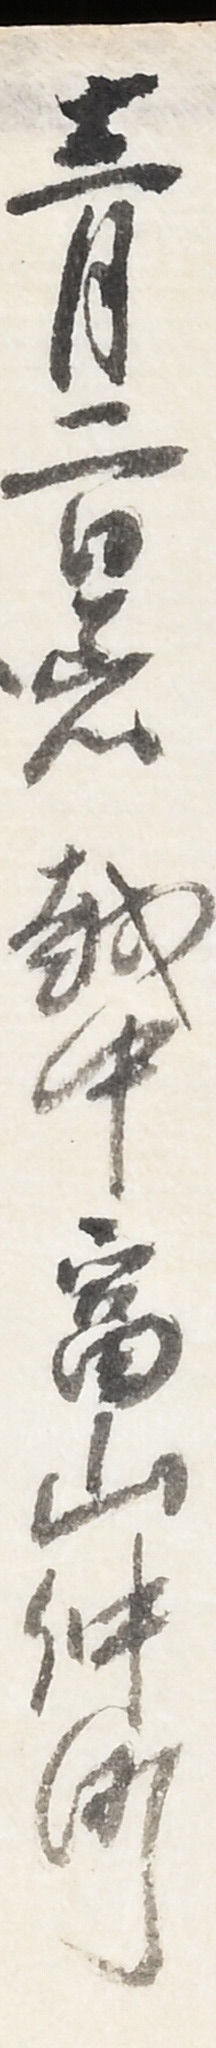十二月二日着越中富山仲町
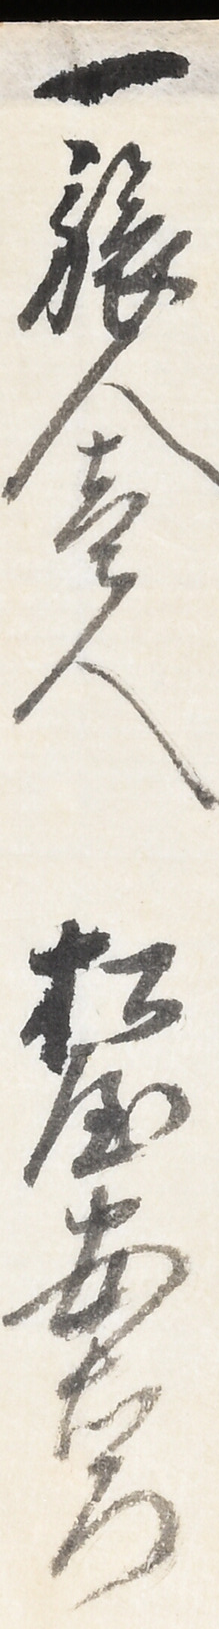一旅人壱人松屋安右衛門
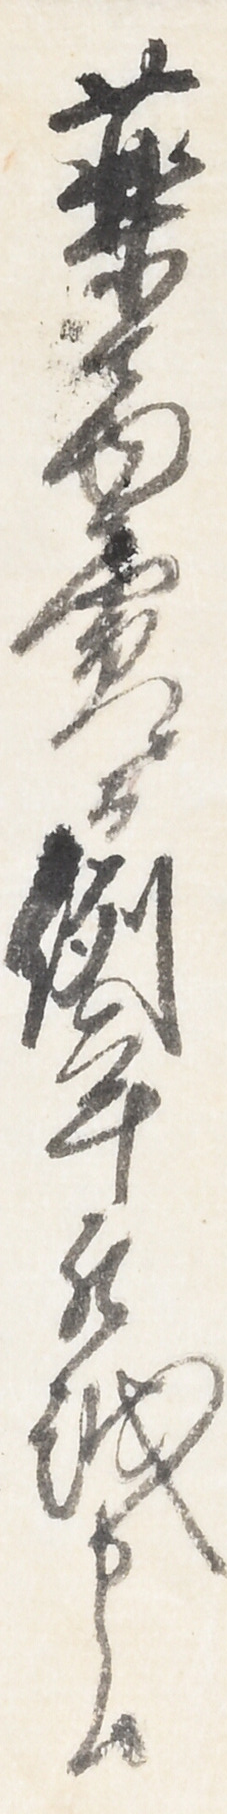御用達ニ而例年罷越申候
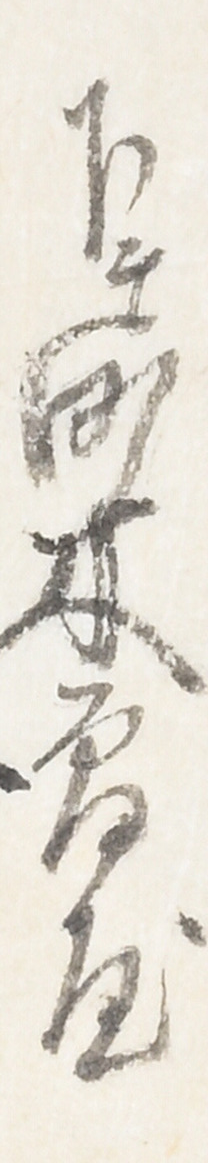下モ町木曽屋
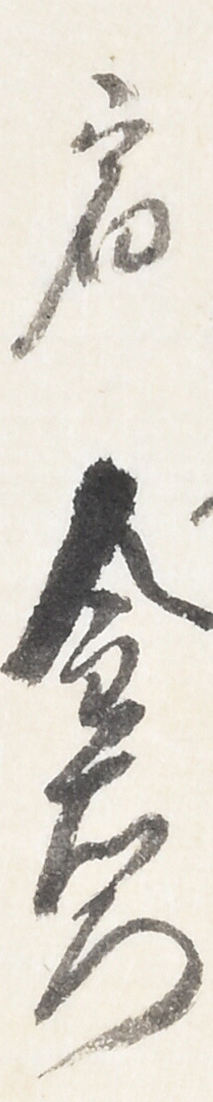宿金右衛門
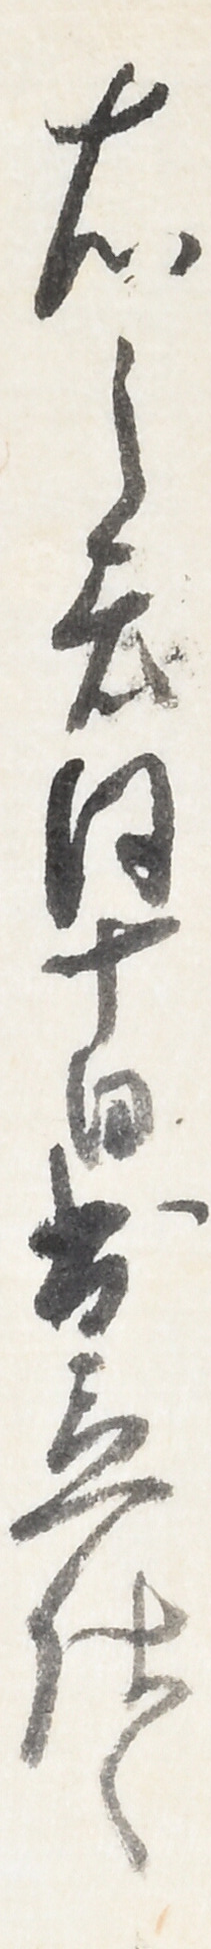右之者同十日出立仕候
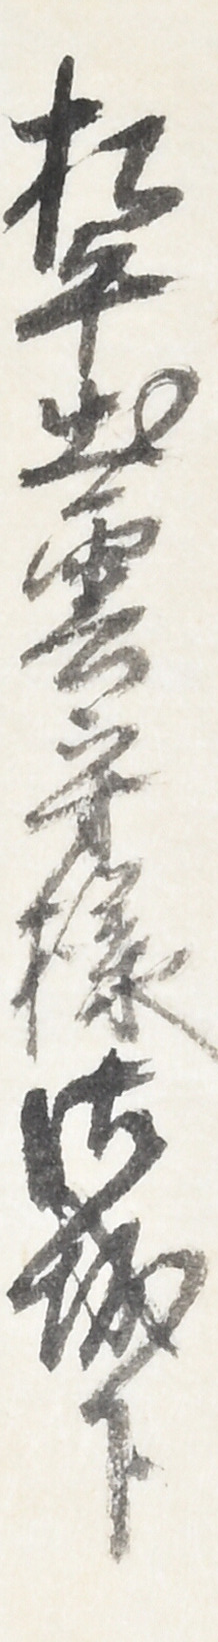松平出雲守様御城下
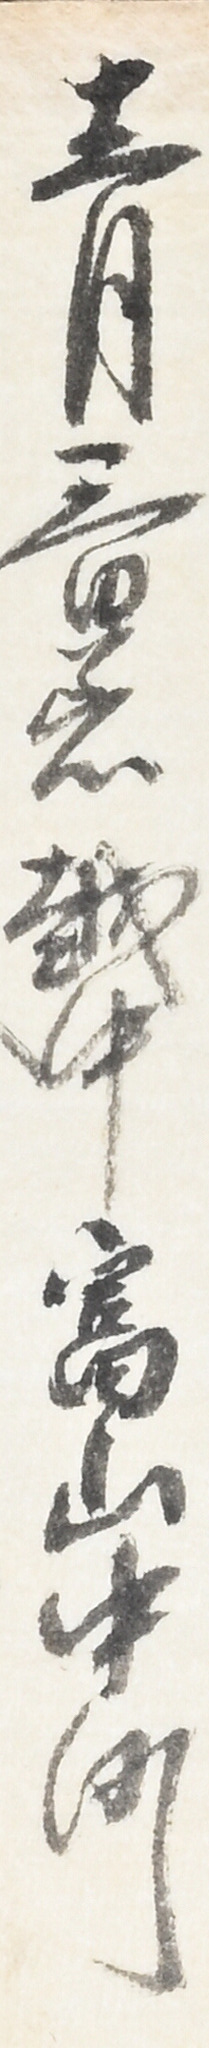十二月三日着越中富山中町
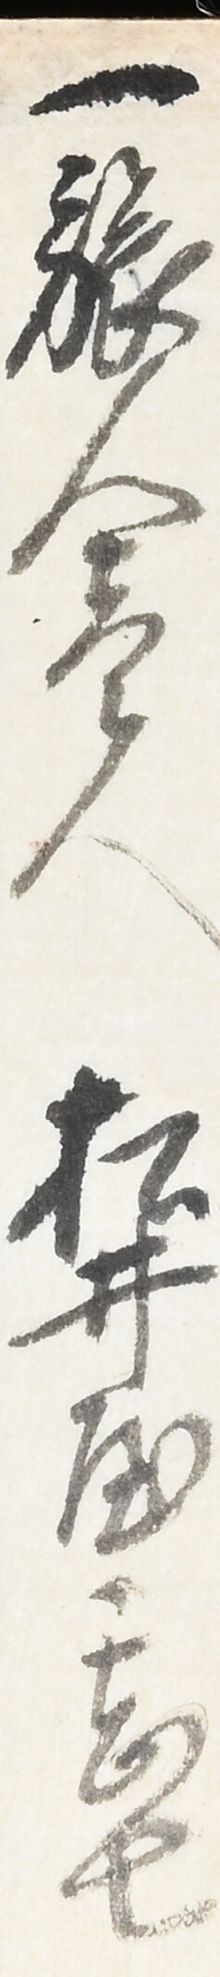一旅人壱人松井屋甚七
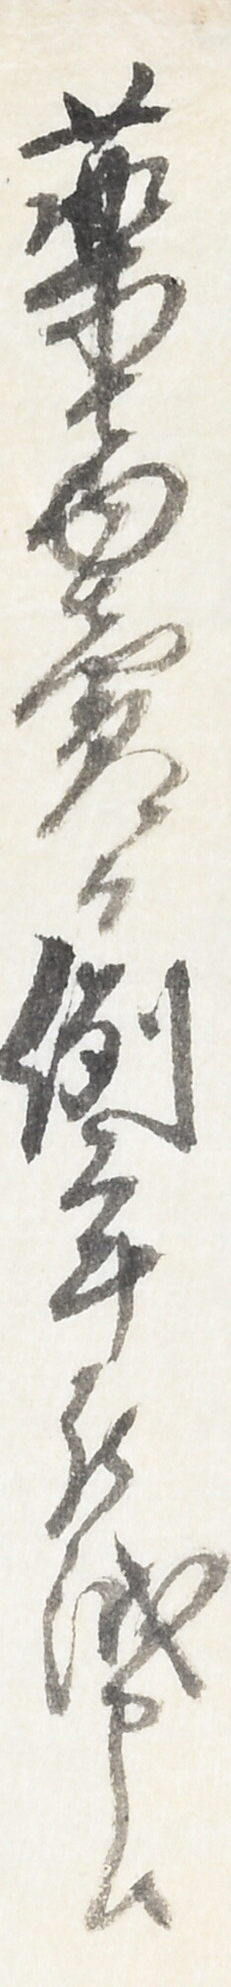薬商売ニ而例年罷越申候
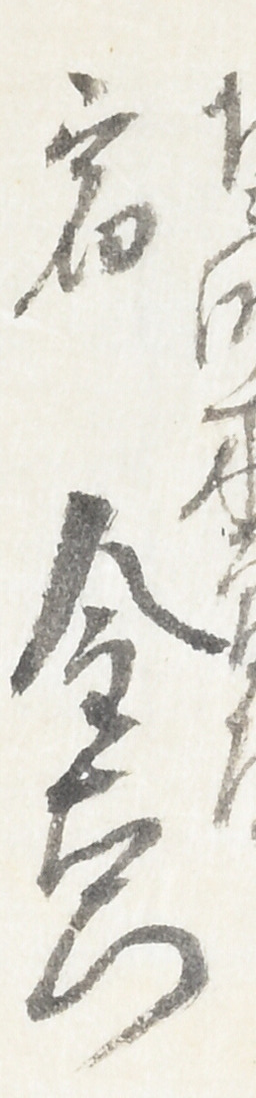宿金右衛門
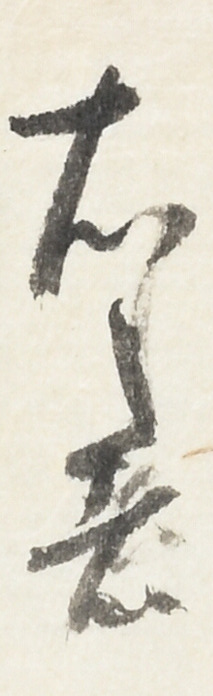右之者

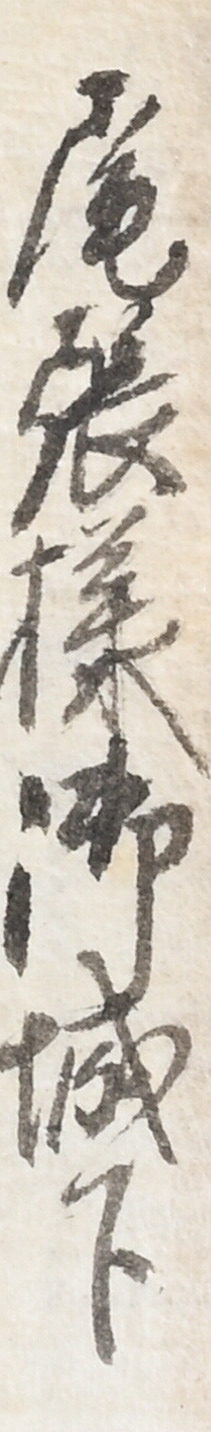尾張様御城下
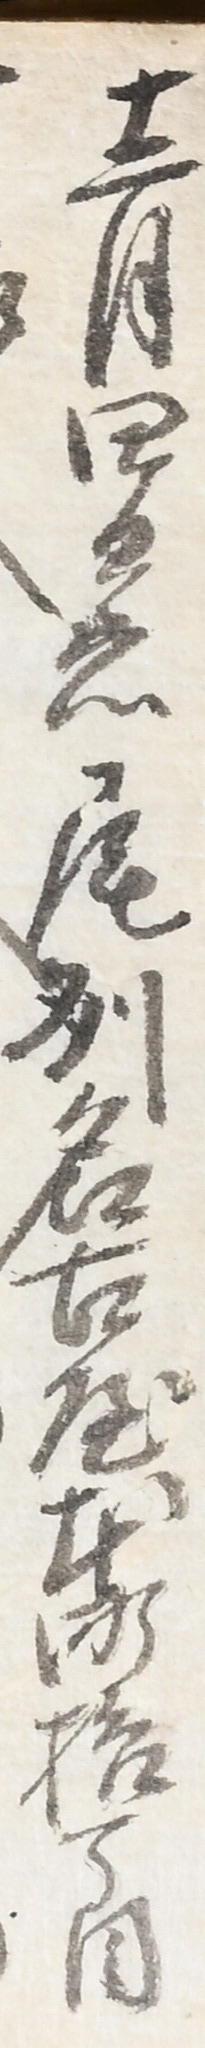十二月四日着尾州名古屋本町拾丁目
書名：旅人泊控帳
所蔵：伊那市立高遠町図書館・合同会社AMANE
